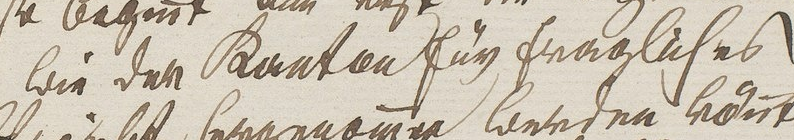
wie der Kanton für fragliches
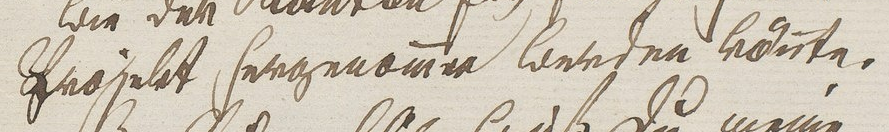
Projekt hergenommen werden könnte.
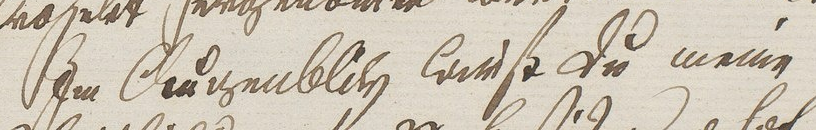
Im Augenblick wirst Du meine
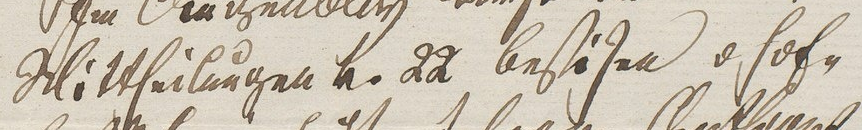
Mittheilungen v. 22 besitzen & hof-
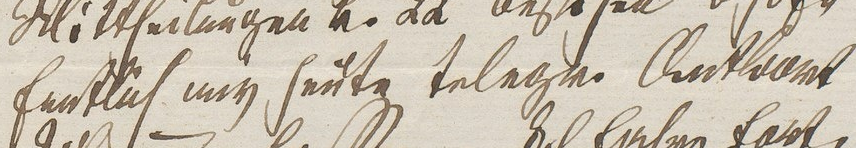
fentlich mir heute telegr. Antwort
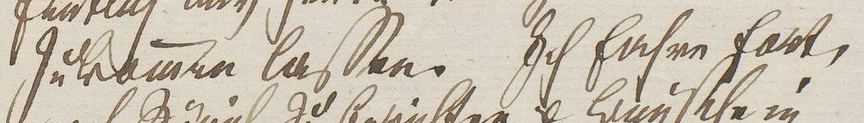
zukommen lassen. Ich fahre fort,
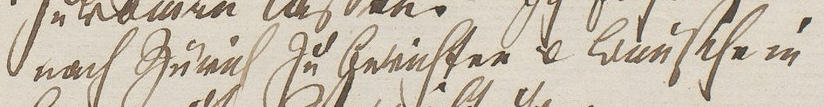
nach Zürich zu berichten & wünsche in
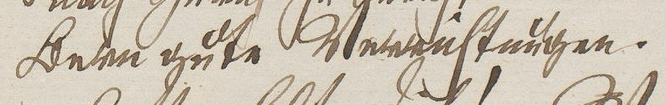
Bern gute Verrichtungen.
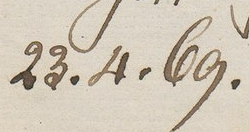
23. 4. 69.
